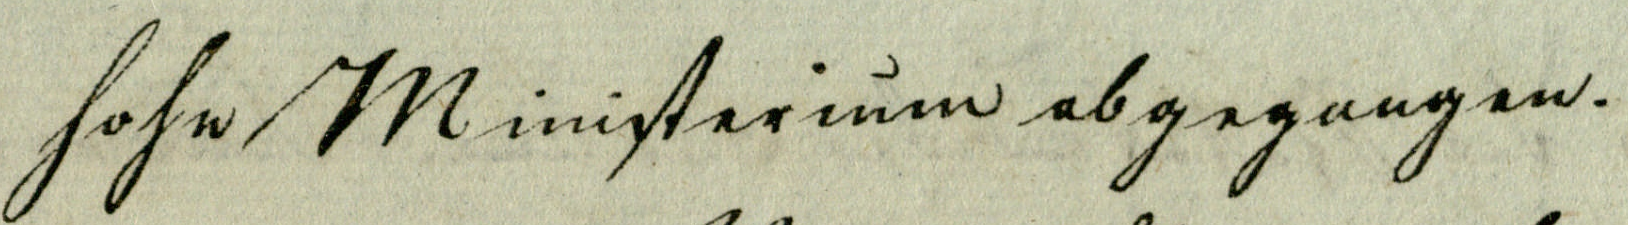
hohe Ministerium abgegangen.
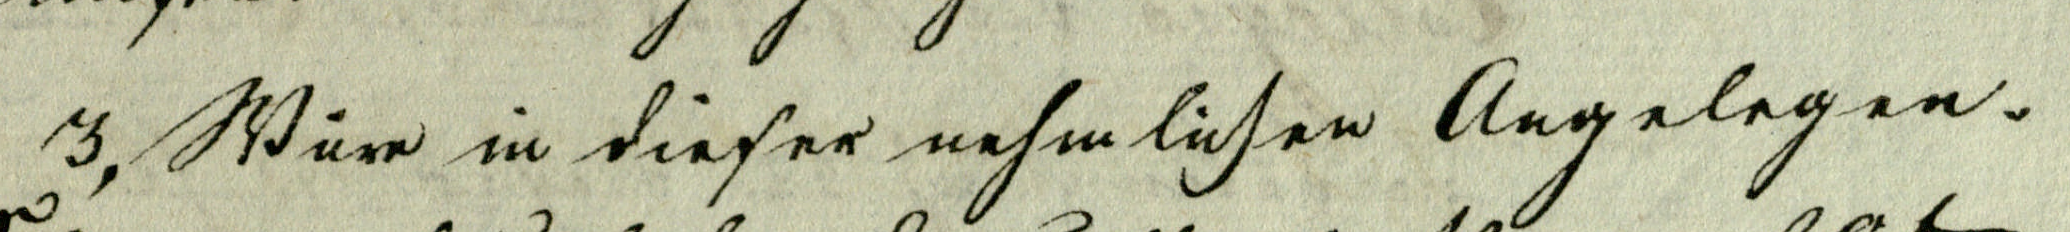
3, Wäre in dieser nehmlichen Angelegen¬
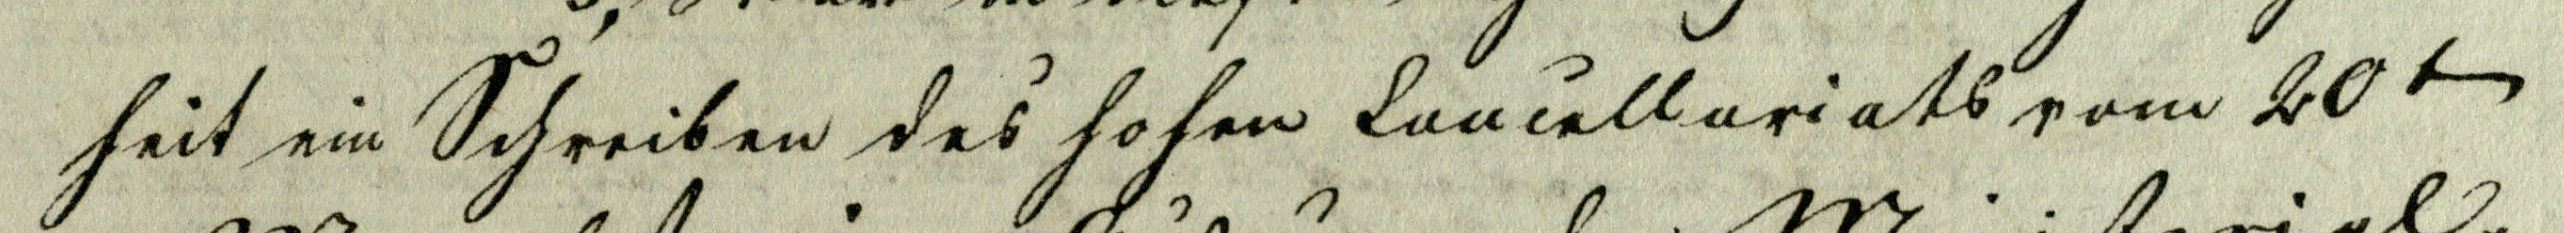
heit ein Schreiben des hohen Cancellariats vom 20ten
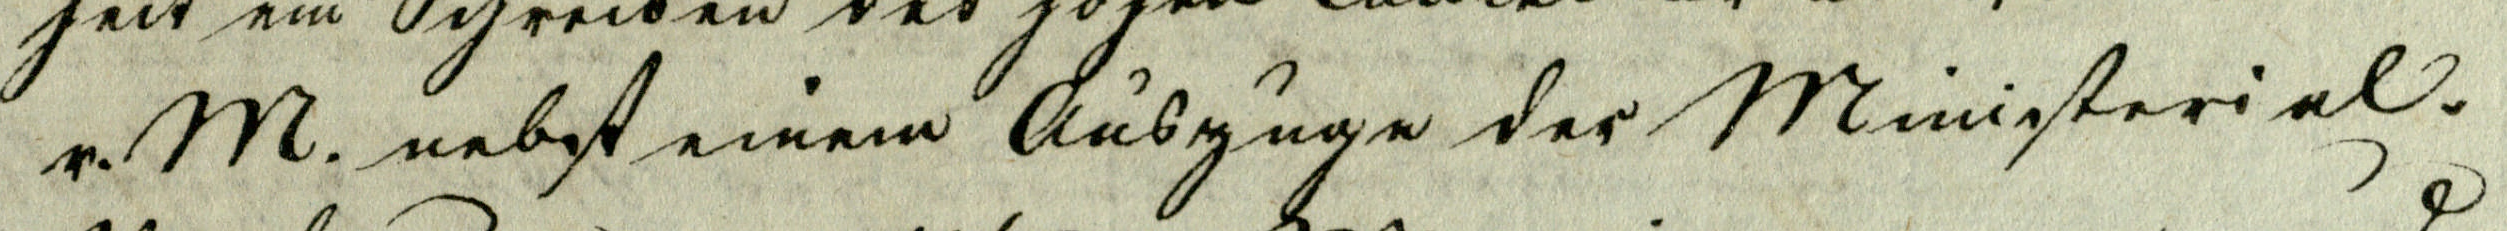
v. M. nebst einem Auszuge der Ministerial¬
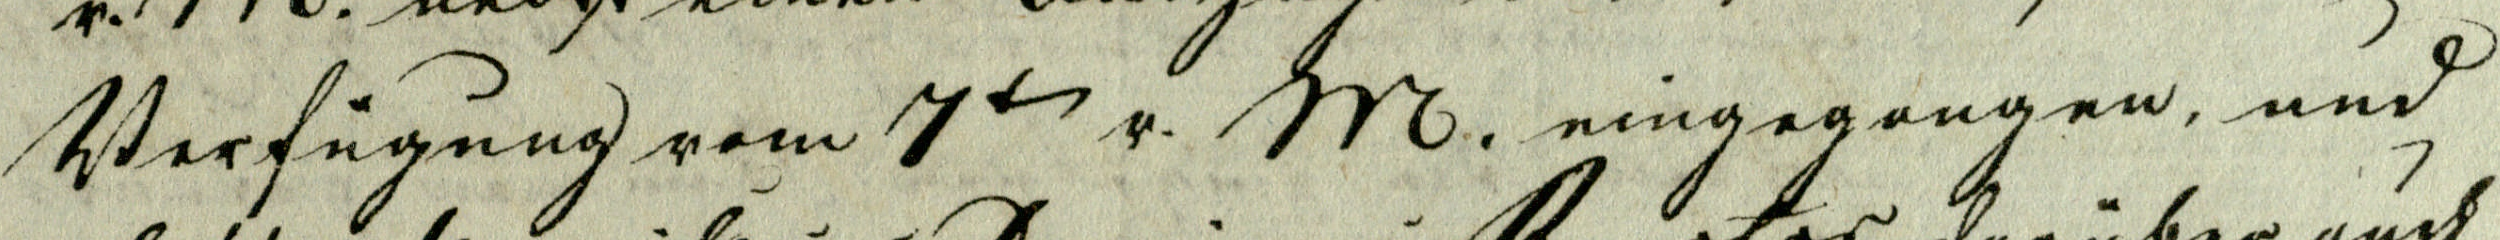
Verfügung vom 7ten v. M. eingegangen, und
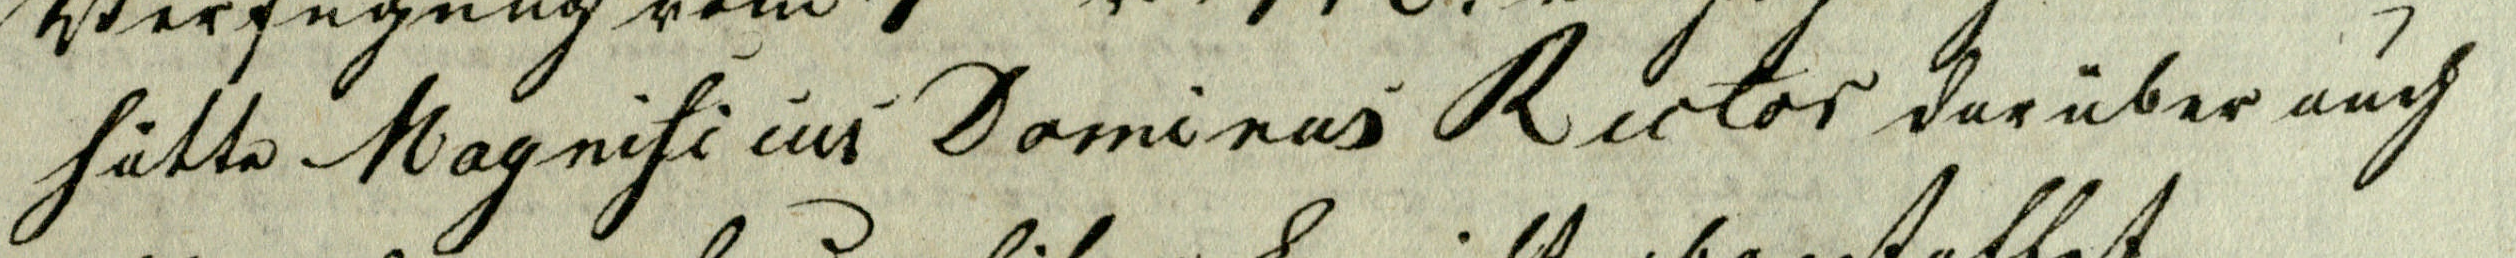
hätte Magnificus Dominus Rector darüber auch
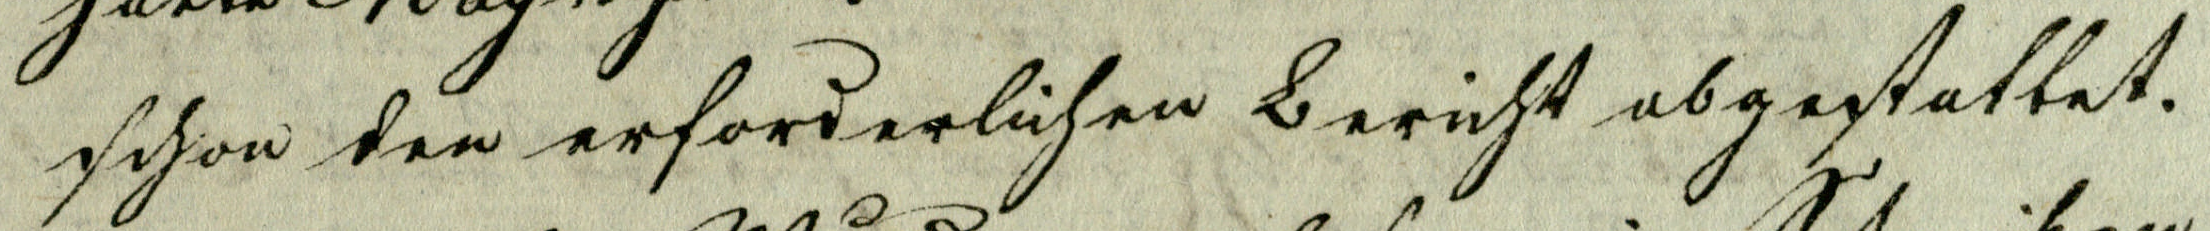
schon den erforderlichen Bericht abgestattet.
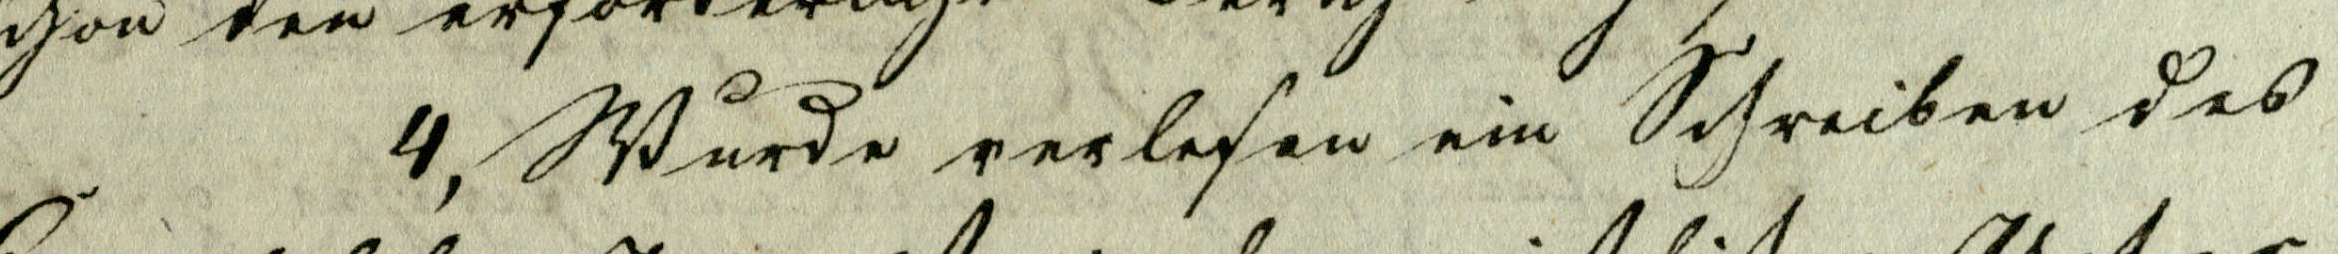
4, Wurde verlesen ein Schreiben des
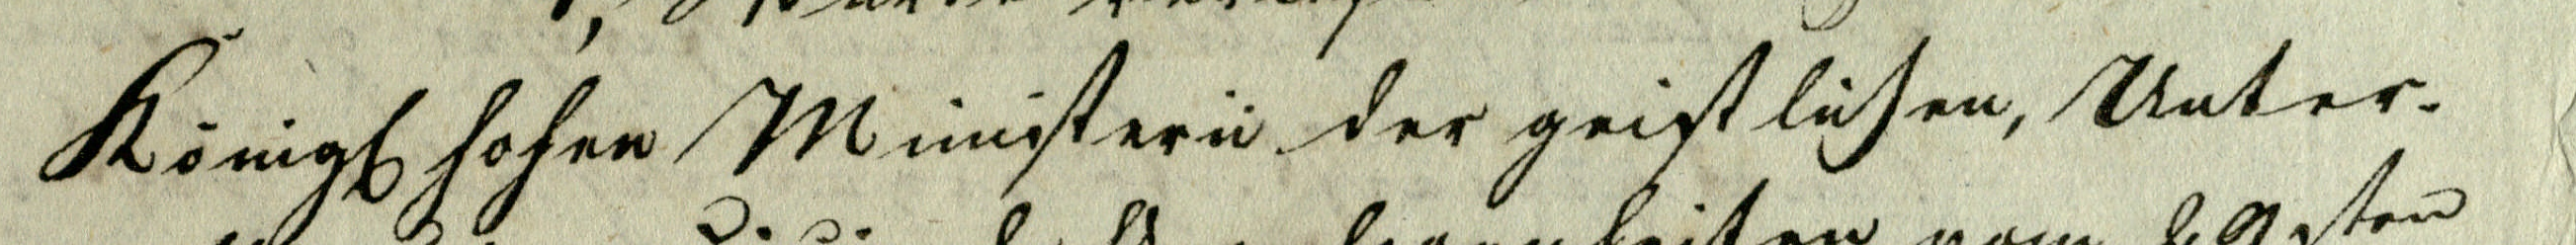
Königlichen Ministerii der geistlichen, Unter¬
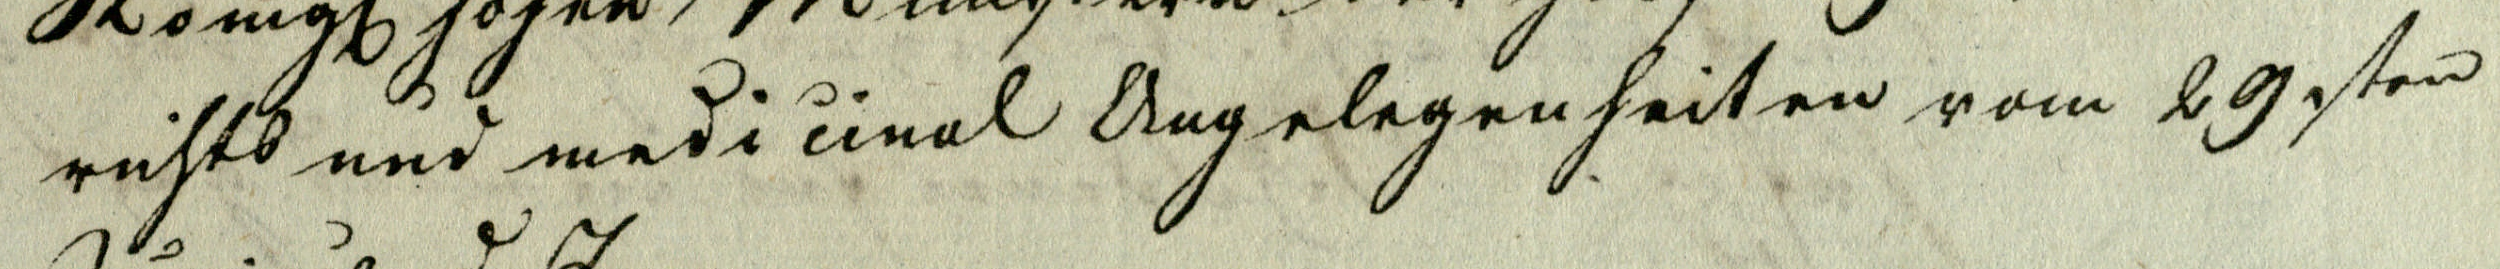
richts und medicinal Angelegenheiten vom 29ten
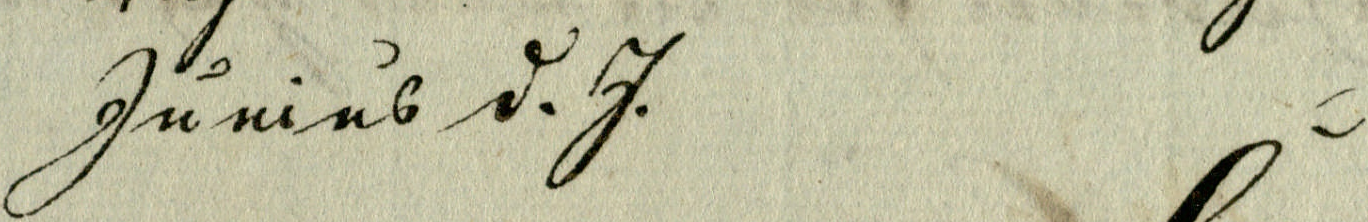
Junius d. J.
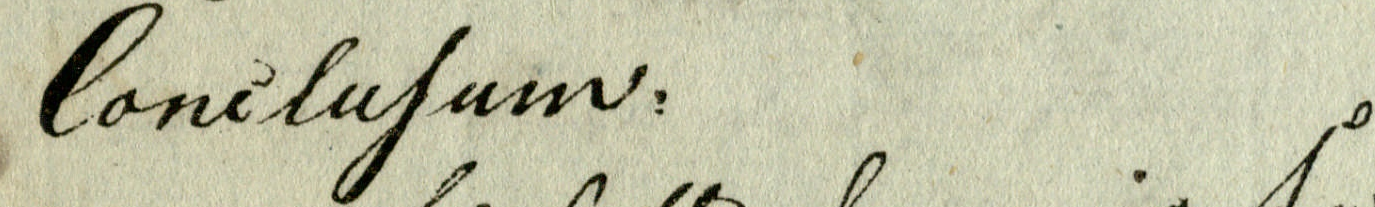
Conclusum:
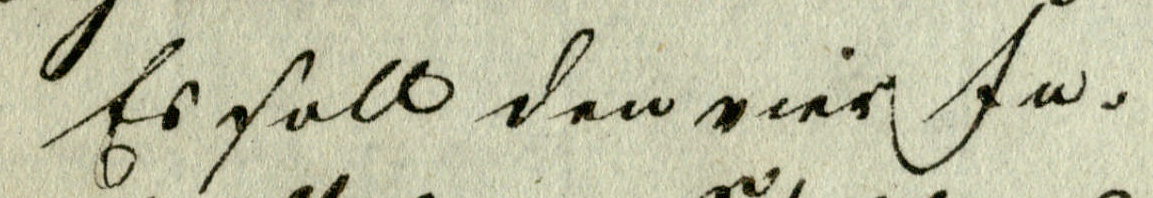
Es soll den vier Fa¬
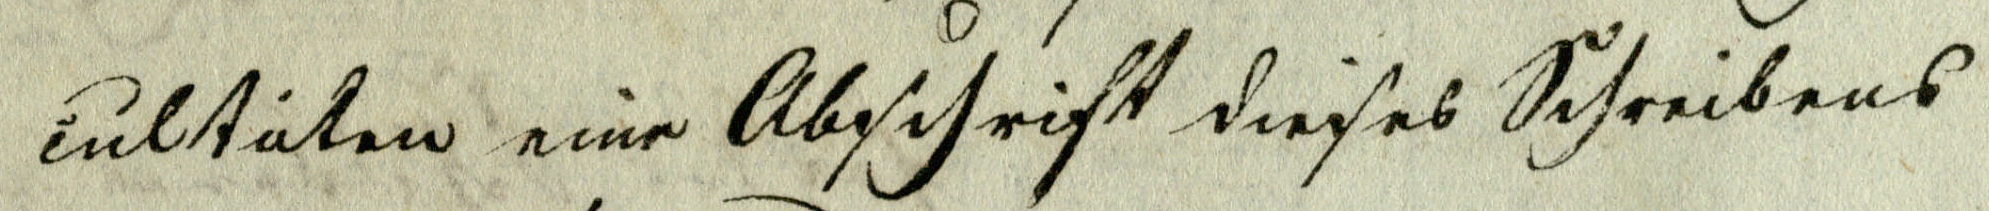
cultäten eine Abschrift dieses Schreibens
